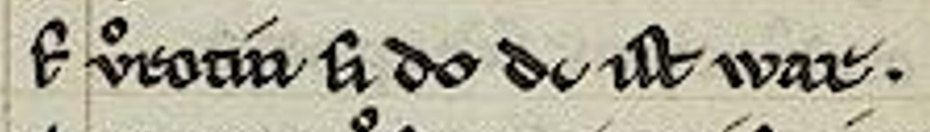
Fv°orotin ſi do d(az) iſt war.
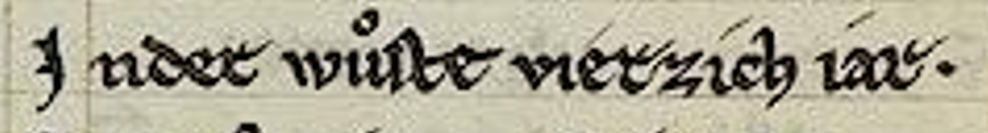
Inder wu°oſte vierzich iar.
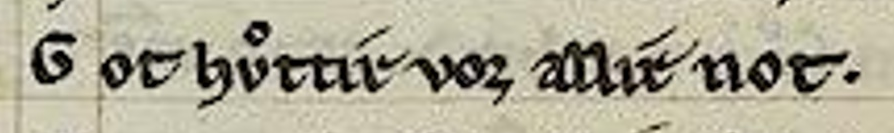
Got hv°ottir vor allir not.
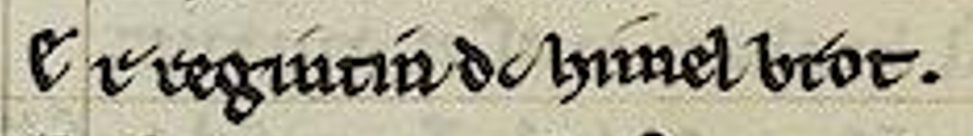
Er regintin d(az) himel brot.
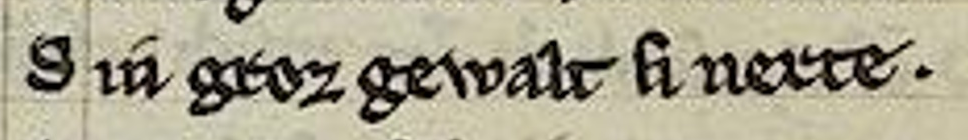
Sin groz gewalt ſi nerte.
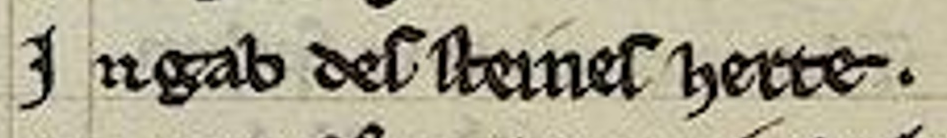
In gab deſ ſteineſ herte.
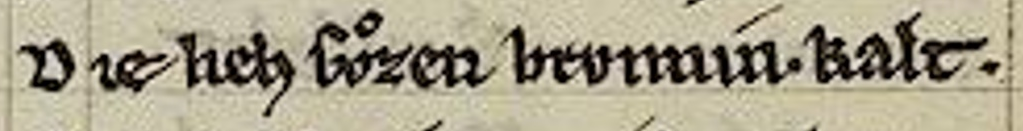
Die lieh ſv°ozen brvnnin. kalt.
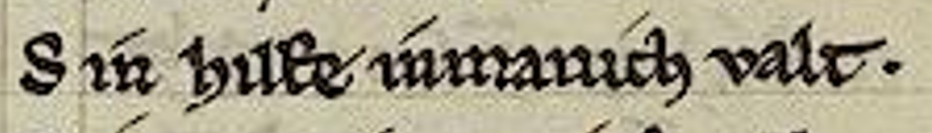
Sin hilfe inmanich valt.
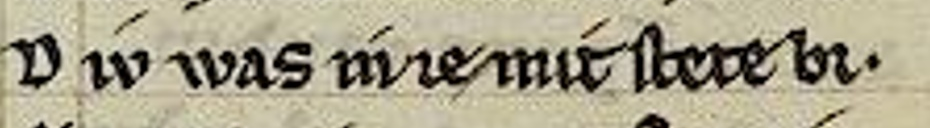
Div was in ie mit ſtete bi.
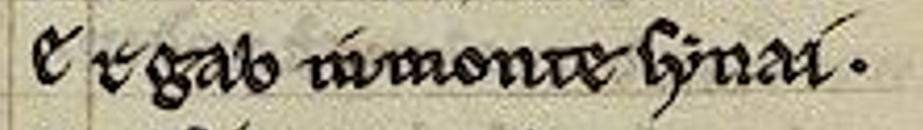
Er gab in monte ſynai.
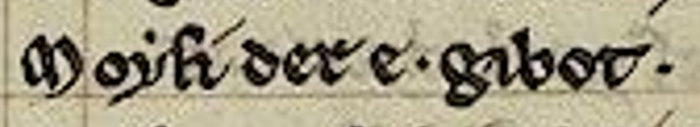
Moyſi der e. gibot.
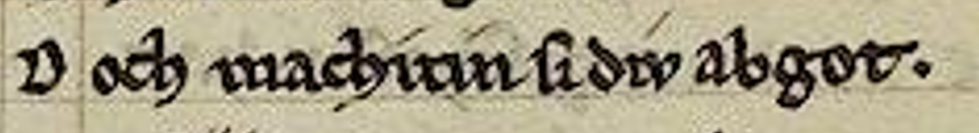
Doch machitin ſi div abgot.
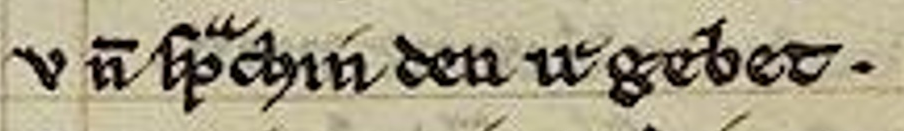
Vn(d) ſp(ra)chin den ir gebet.
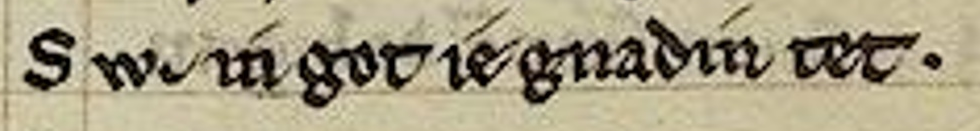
Sw(az) in got ie gnadin tet.
